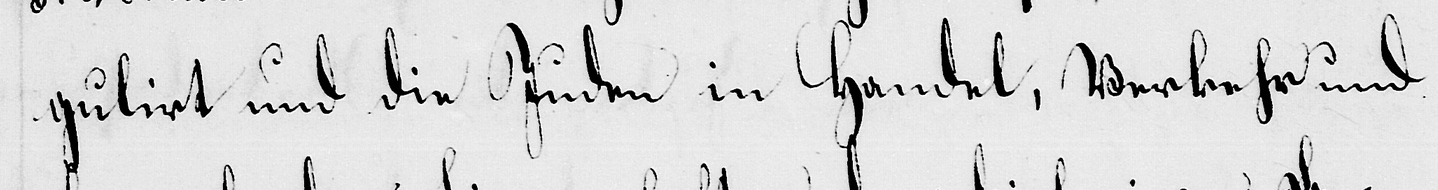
gulirt und die Juden in Handel, Verkehr und
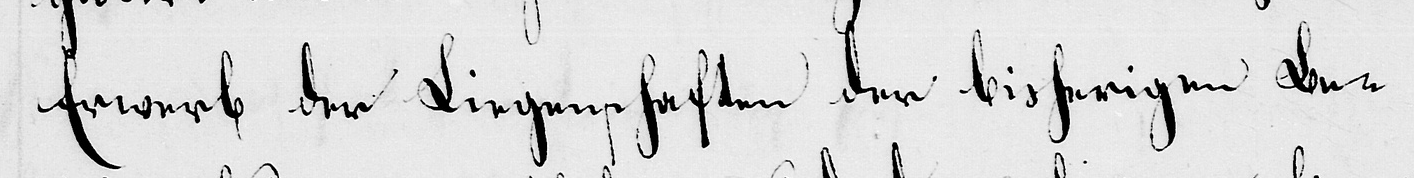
Erwerb der Liegenschaften der bisherigen Be¬
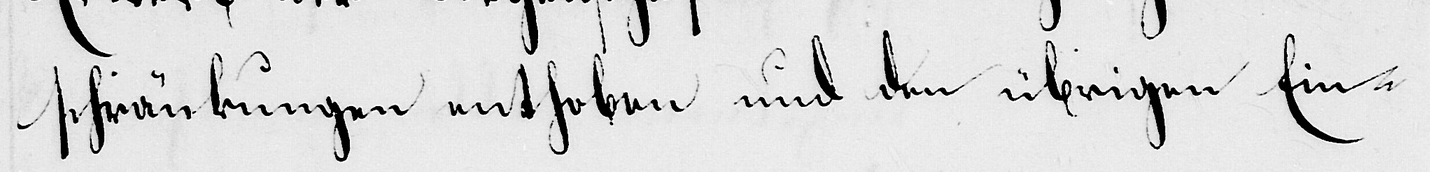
schränkungen enthoben und den übrigen Ein¬
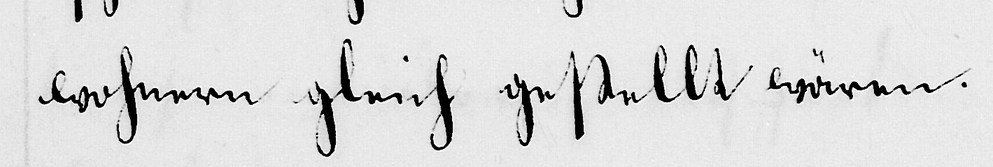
wohnern gleich gestellt wären.
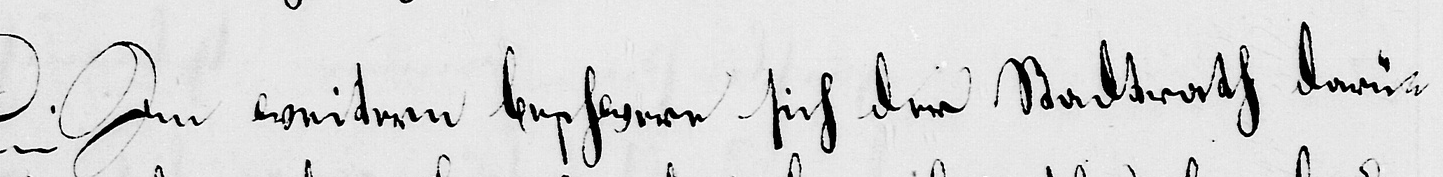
Im weitern beschwere sich der Stadtrath darü¬
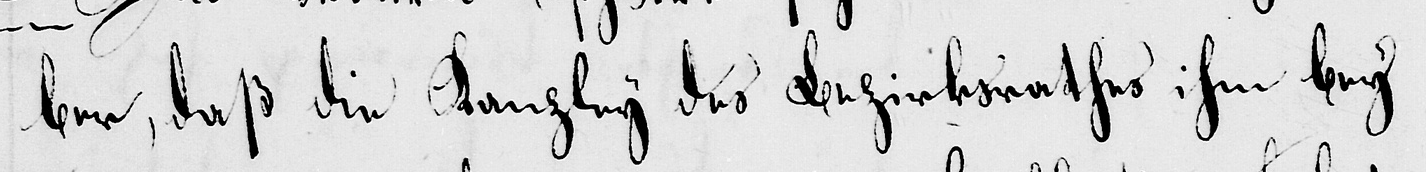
ber, daß die Kanzley des Bezirksrathes ihm bey
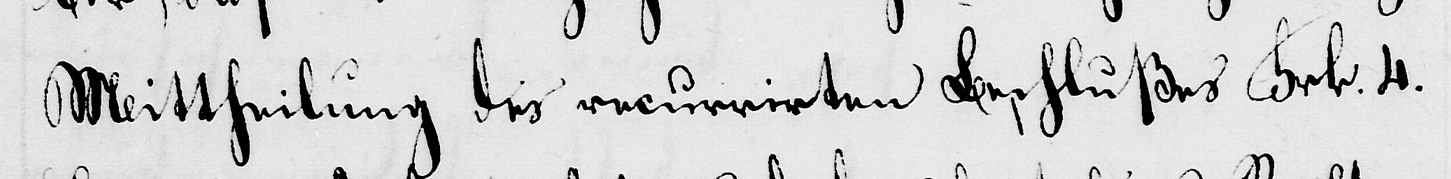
Mittheilung des recurrirten Beschlußes Frk. 4.
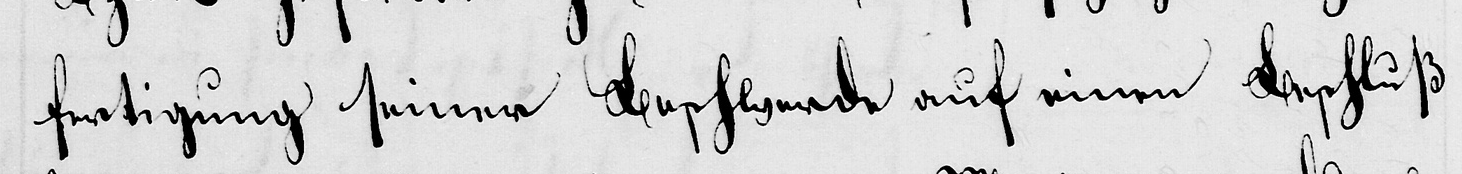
fertigung seiner Beschwerde auf einen Beschluß
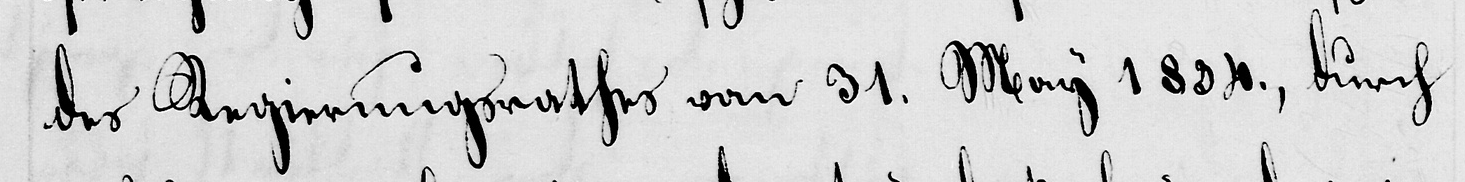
des Regierungsrathes vom 31. May 1834., durch
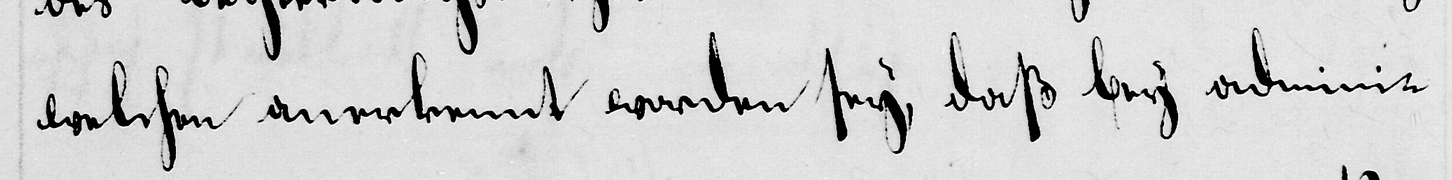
welchen anerkannt worden sey, daß bey admini-
